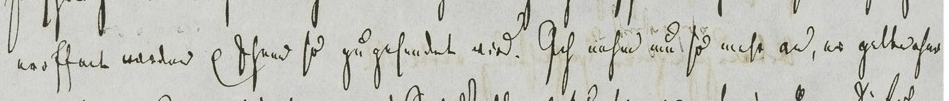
eröffnet worden & Ihnen so zugesendet wird. Ich nahm um so mehr an, es gelte eher
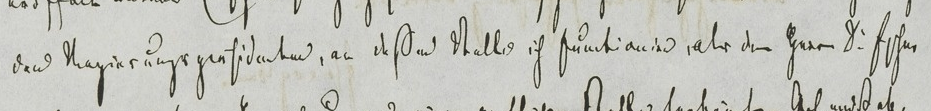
den Regierungspräsidenten, an dessen Stelle ich functionire, als dem Herr Dr Escher
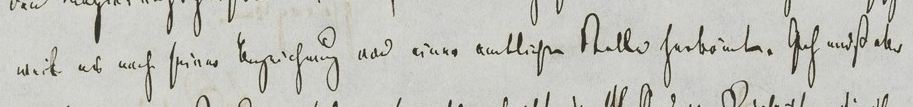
weil es nach seiner Bezeichnung von einer amtlichen Stelle herkommt. Ich muß aber
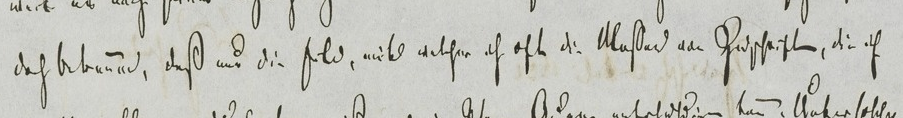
doch bekennen, daß nur die Eile, mit welcher ich oft die Massen von Zuschriften, die ich
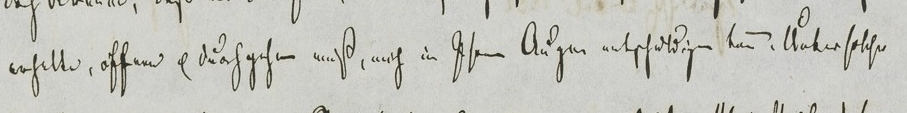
erhalte, öffnen & durchgehen muß, mich in Ihren Augen entschuldigen kann. Unter
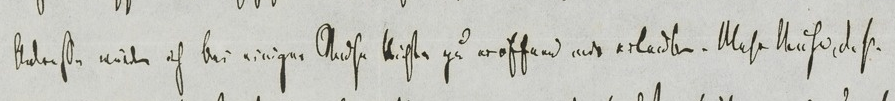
Adresse würde ich bei einiger Ruhe Nichts zu eröffnen mir erlauben. Mehr Muse, d. h.
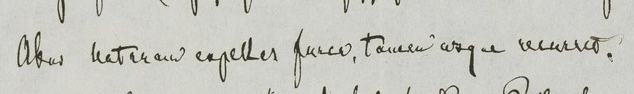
Aber naturam expellas furca, tamen usque recurret.
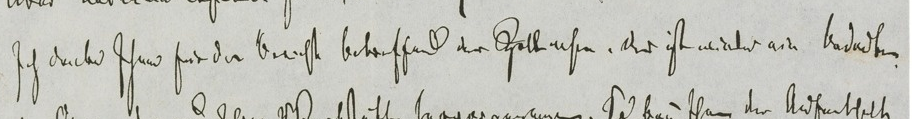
Ich danke Ihnen für den Bericht betreffend das Zollwesen, das ist wieder ein bedeuten-
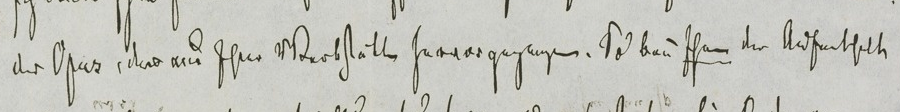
des Opus, das aus Ihrer Werkstätte hervorgegangen. So kann Ihnen der Aufenthalt
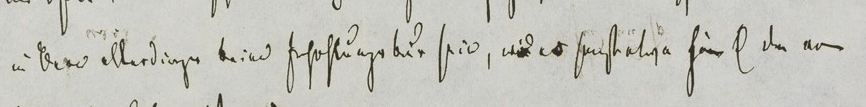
in Bern allerdings keine Erhohlungskur sein, wird es wie er sonstetwa hie &
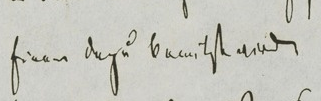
Einem dazu benützt wird.
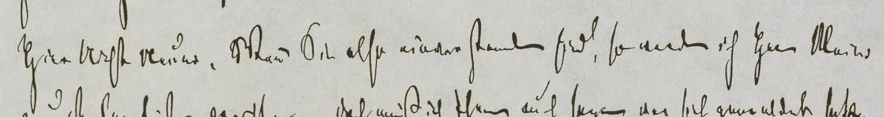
Hier Nichts Neues. Wenn Sie also einverstanden sind, so werde ich Herrn Meier
